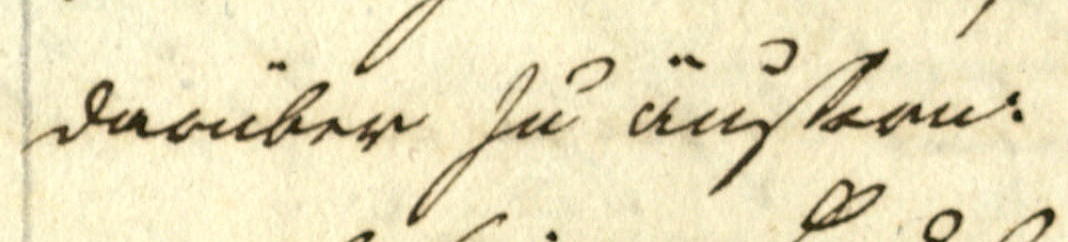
darüber zu äussern:
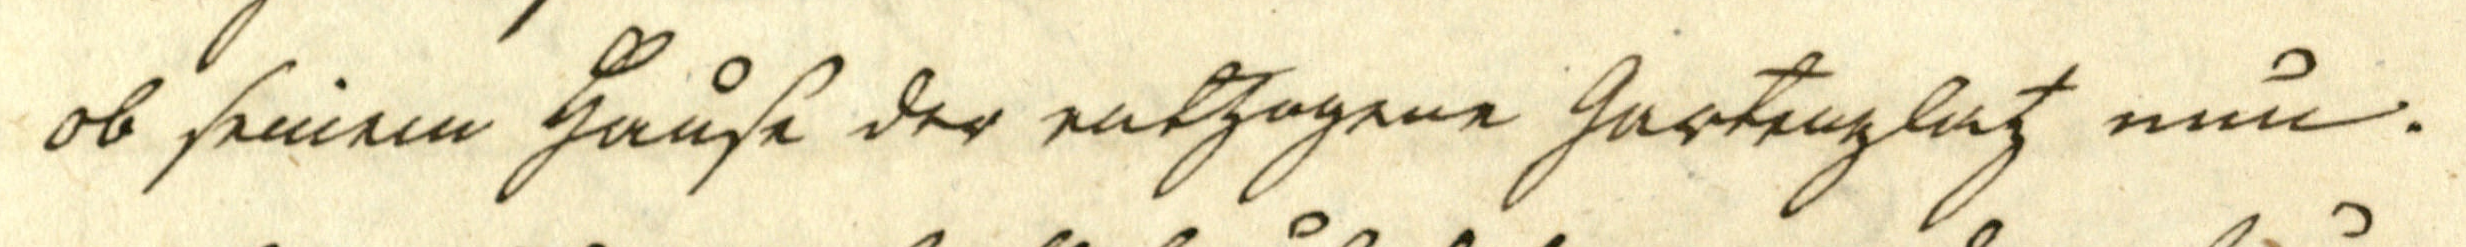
ob seinem Hause der entzogene Gartenplatz nun¬
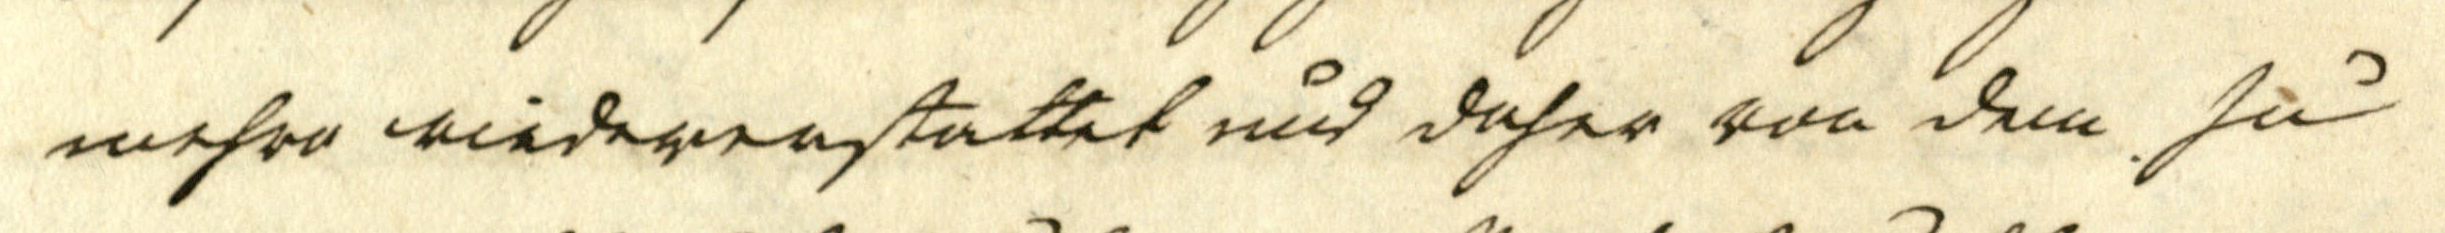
mehr wiedererstattet und daher von dem zu
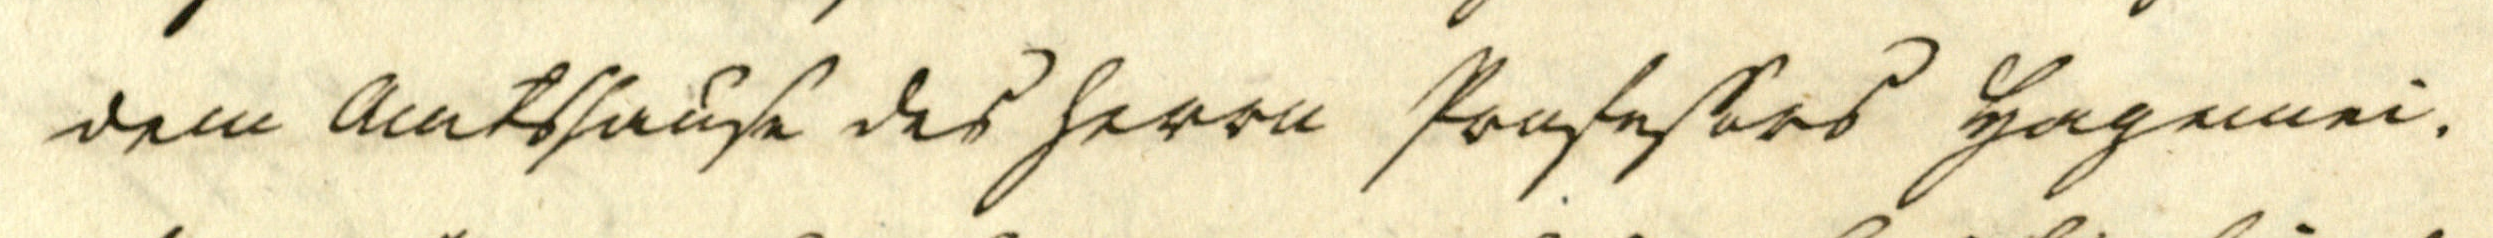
dem Amtshause des Herrn Professors Hagemei¬
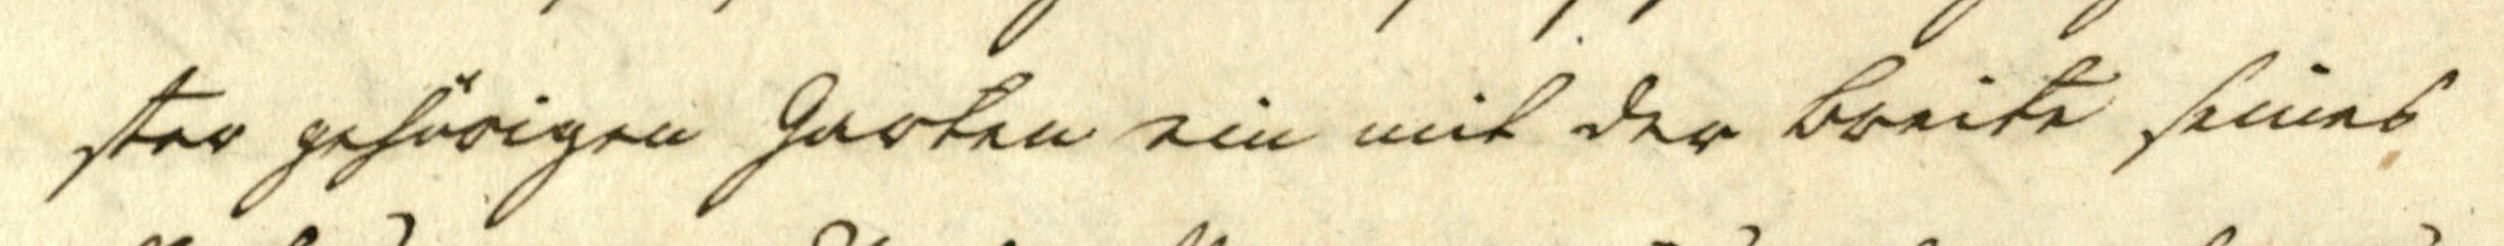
ster gehörigen Garten ein mit der Breite seines
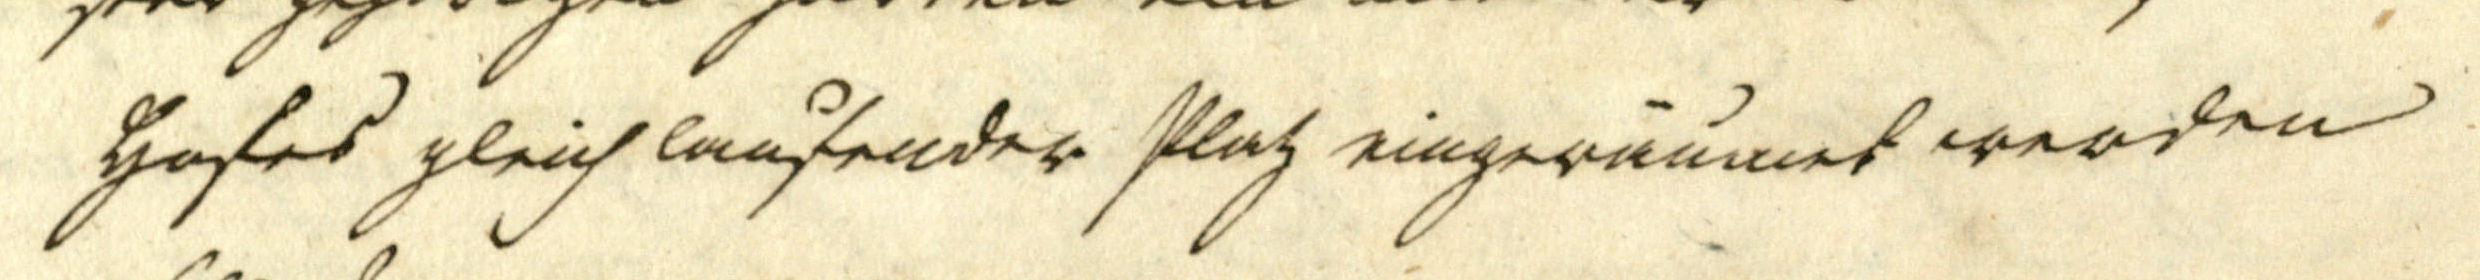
Hofes gleich laufender Platz eingeräumet werden
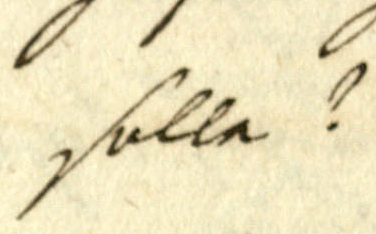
solle?
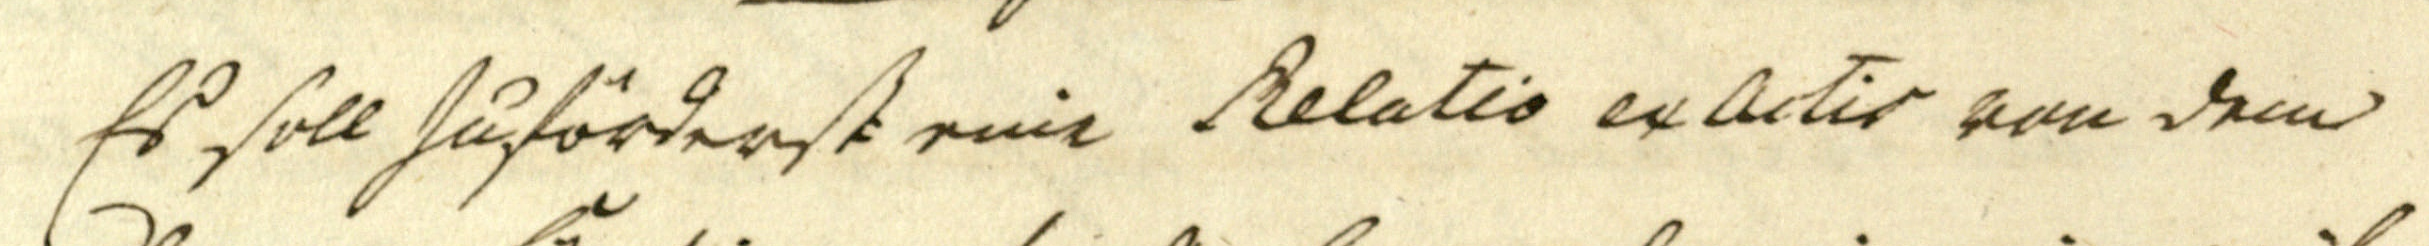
Es soll zuförderst eine Relatio ex Actis von dem
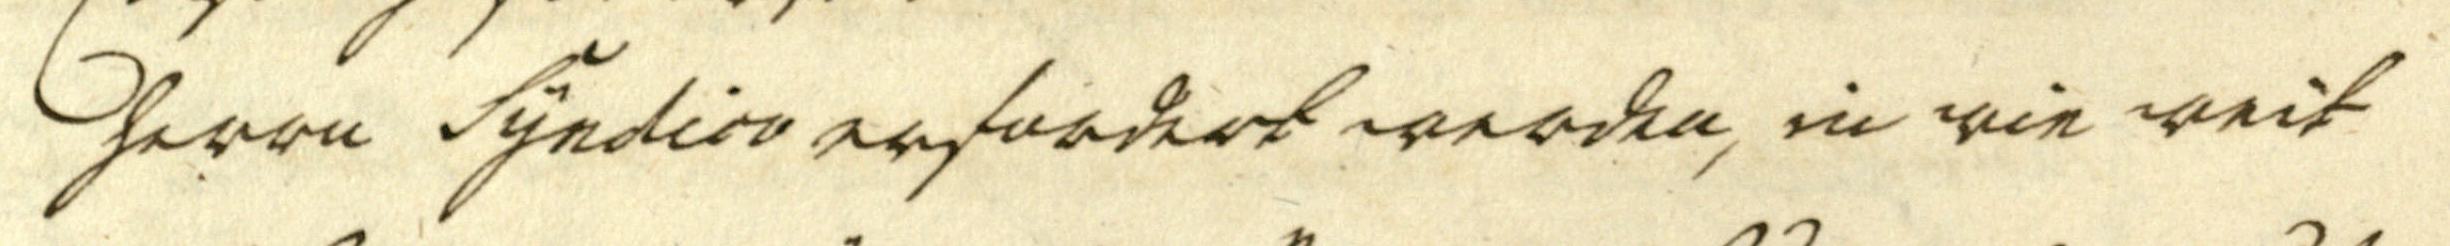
Herrn Sÿndico erfordert werden, in wie weit
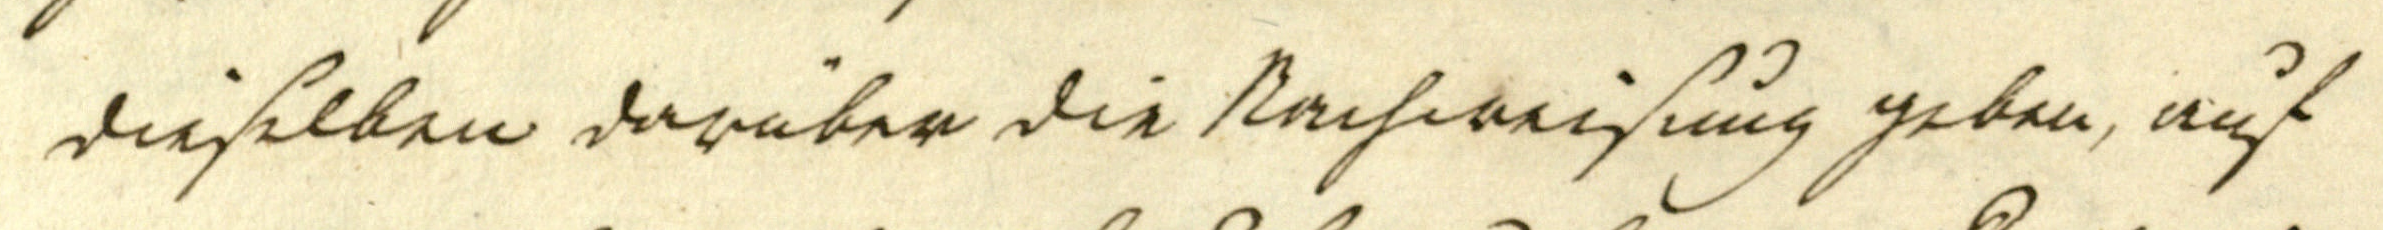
dieselben darüber die Nachweisung geben, auf
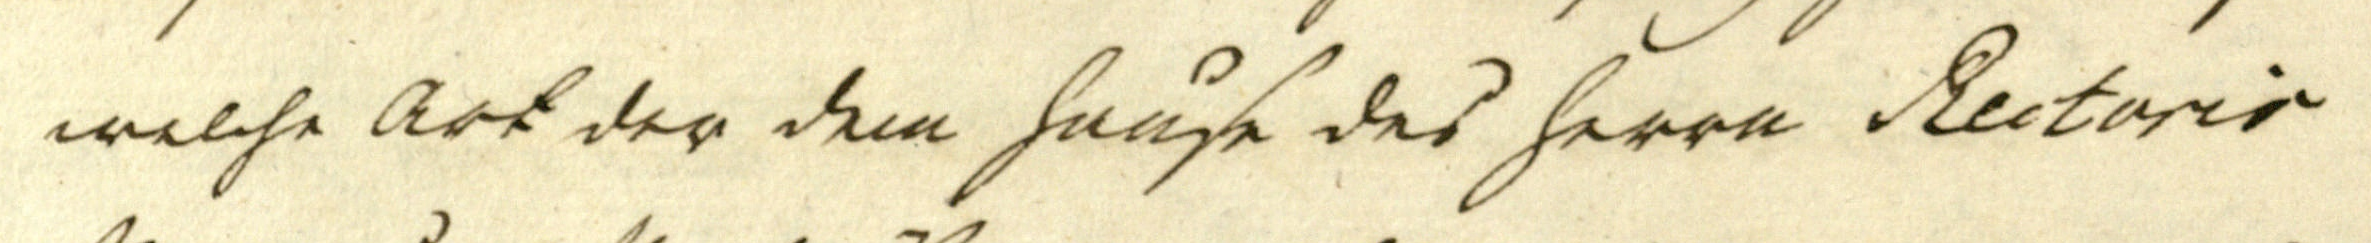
welche Art der dem Hause des Herrn Rectoris
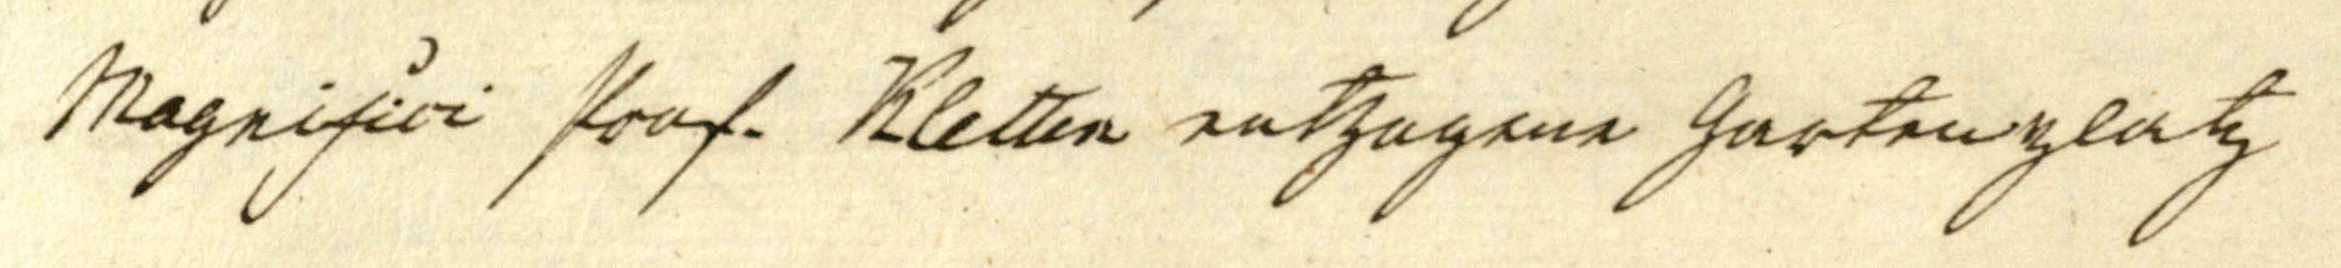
Magnifici Prof. Kletten entzogene Gartenplatz
